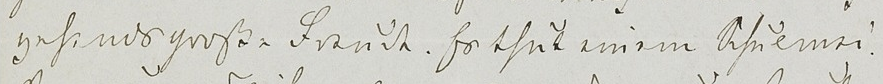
gehends große Freude. Es thut einem Schulmei-
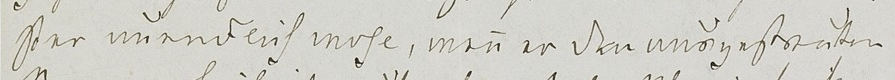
ster unendlich wohl, wenn er den ausgestreuten
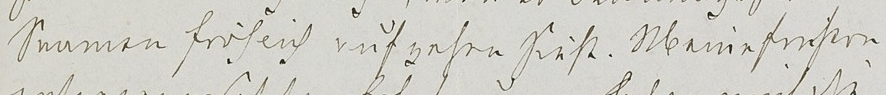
Saamen fröhlich aufgehen sieht. Meine frühern
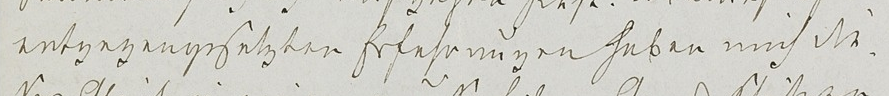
entgegengesetzten Erfahrungen haben mich die-
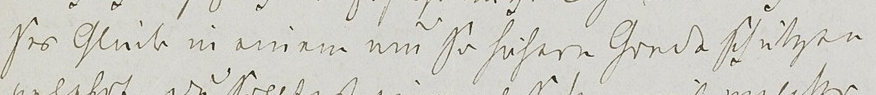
ses Glück in einem um so höhern Grad schätzen
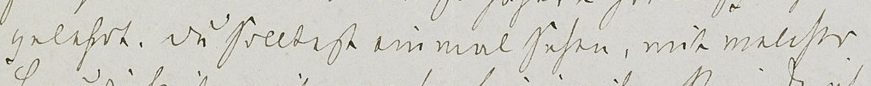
gelehrt. Du solltest ein mal sehen, mit welcher
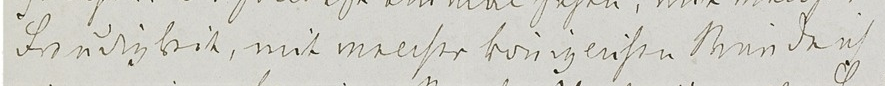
Freudigkeit, mit welcher königlichen Würde ich
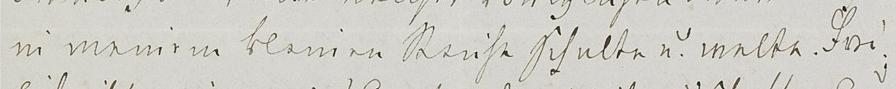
in meinem kleinen Reiche schalte u. walte. Frei-
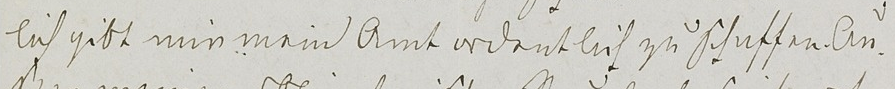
lich gibt mir mein Amt ordentlich zu schaffen. Au-
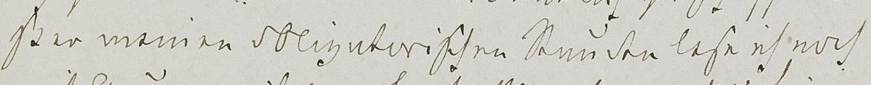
ßer meinen obligatorischen Stunden lese ich noch
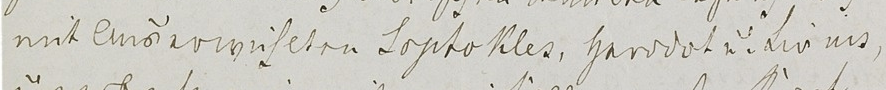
mit Auserwählten Sophokles, Herodot u. Livius,
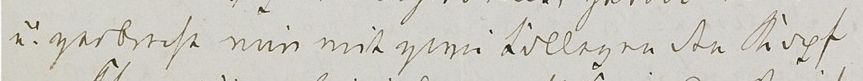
u. zerbreche mir mit mit zwei Kollegen den Kopf
